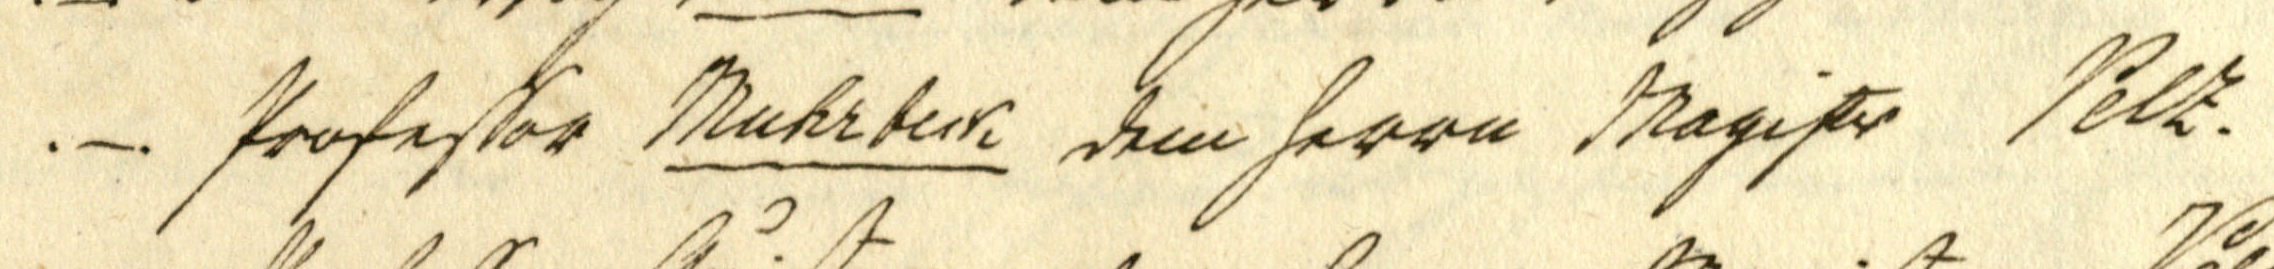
Professor Muhrbeck dem Herrn Magister Pelz.
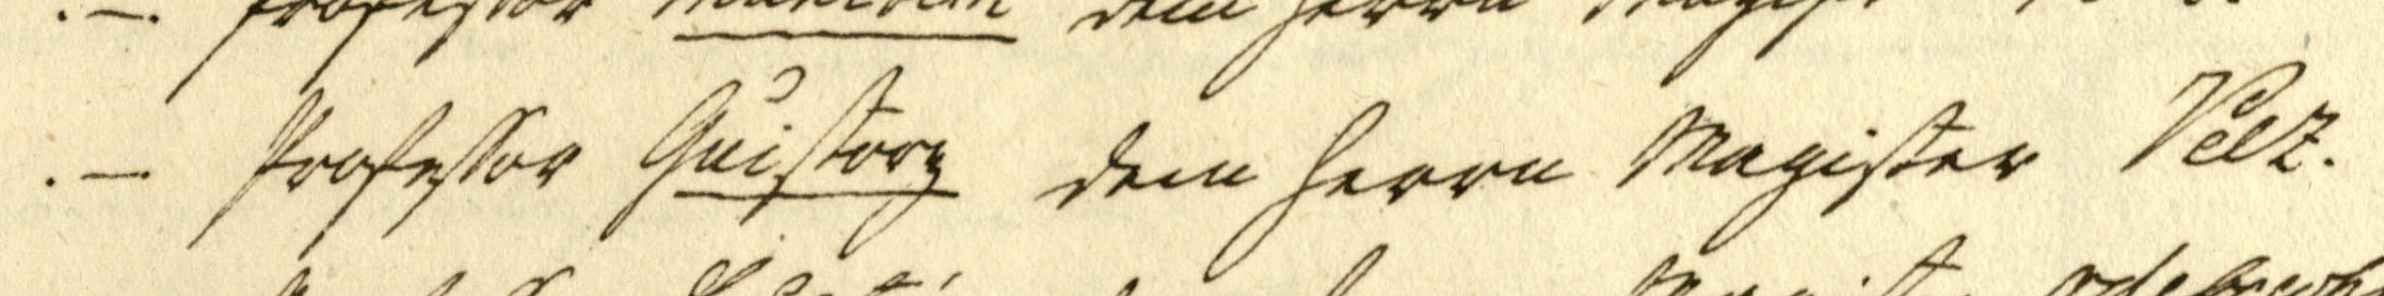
Professor Quistorp dem Herrn Magister Pelz.
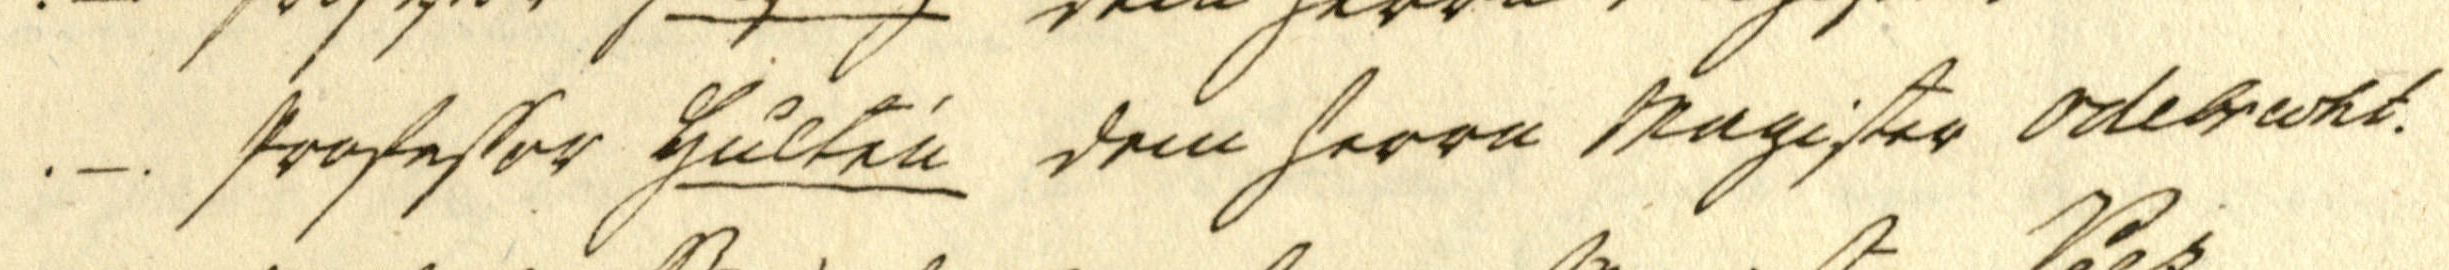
Professor Hultén dem Herrn Magister Odebrecht.
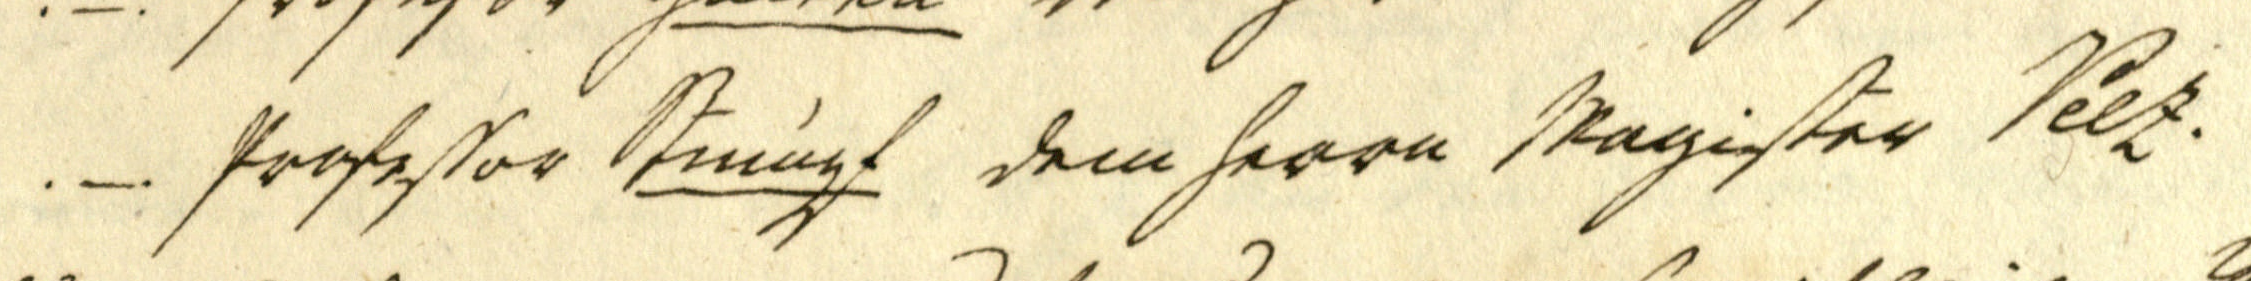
Professor Stumpf dem Herrn Magister Pelz.
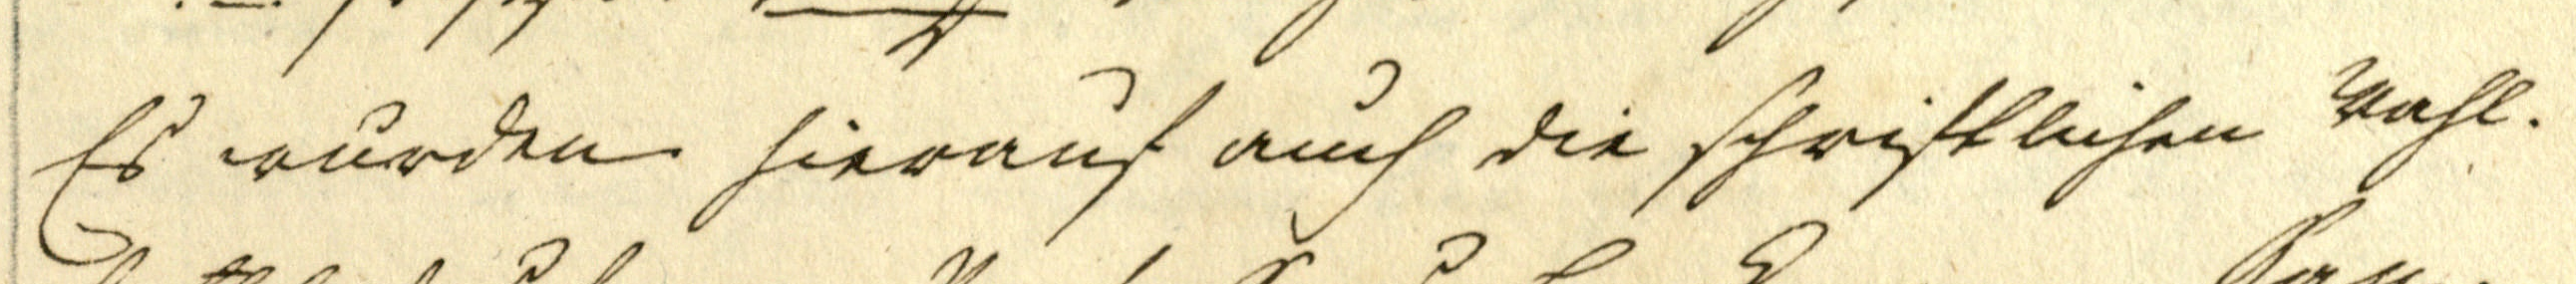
Es wurden hierauf auch die schriftlichen Wahl¬
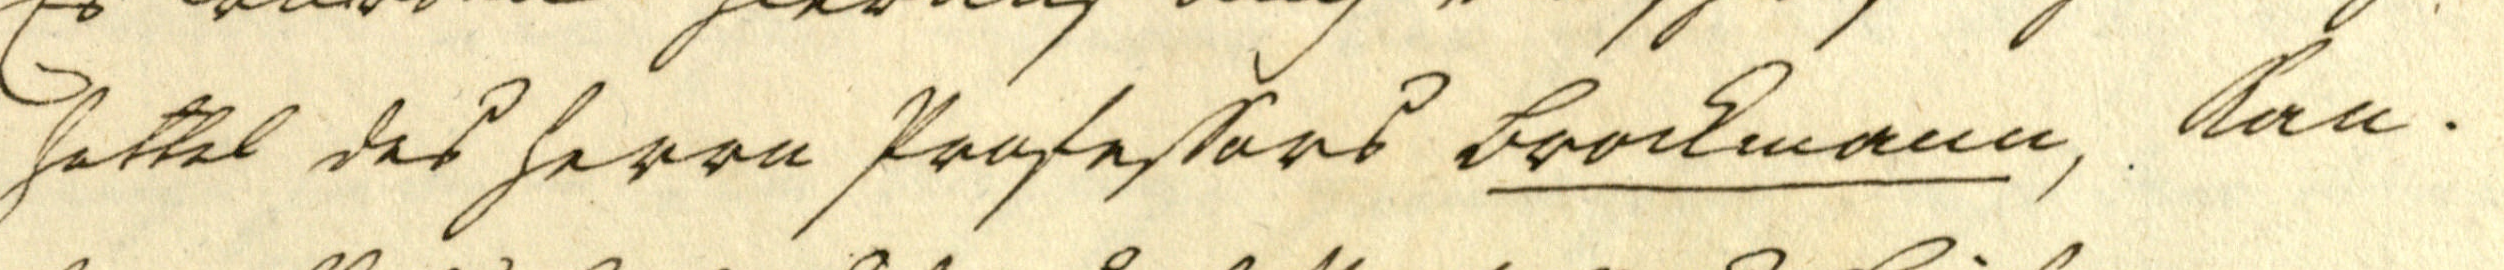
zettel des Herrn Professors Brockmann, Kan-
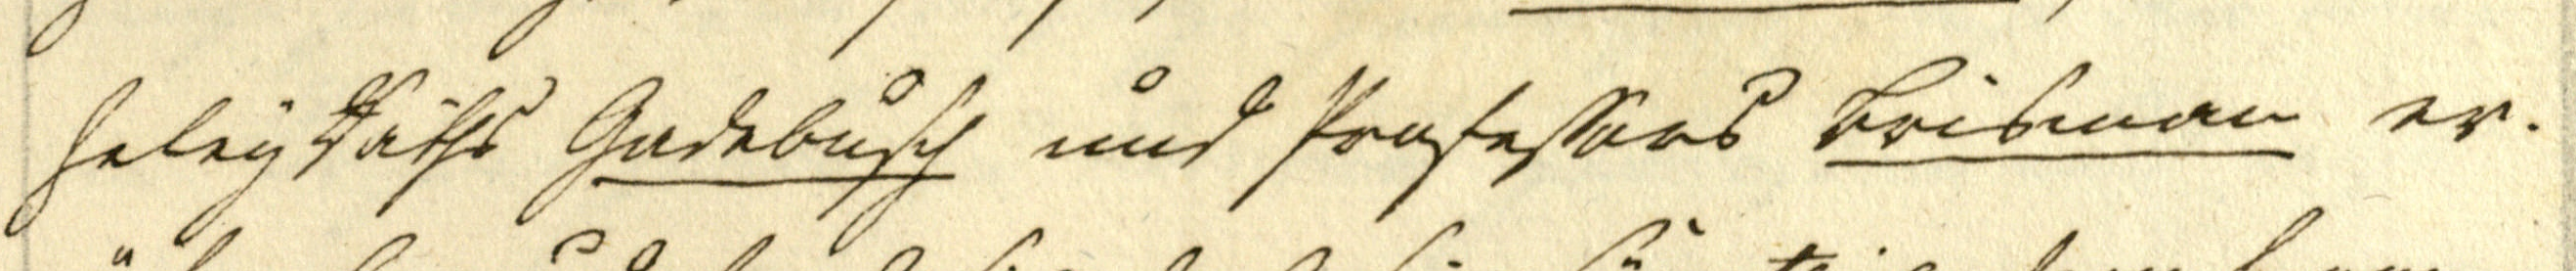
zeleÿ Raths Gadebusch und Professors Brisman er
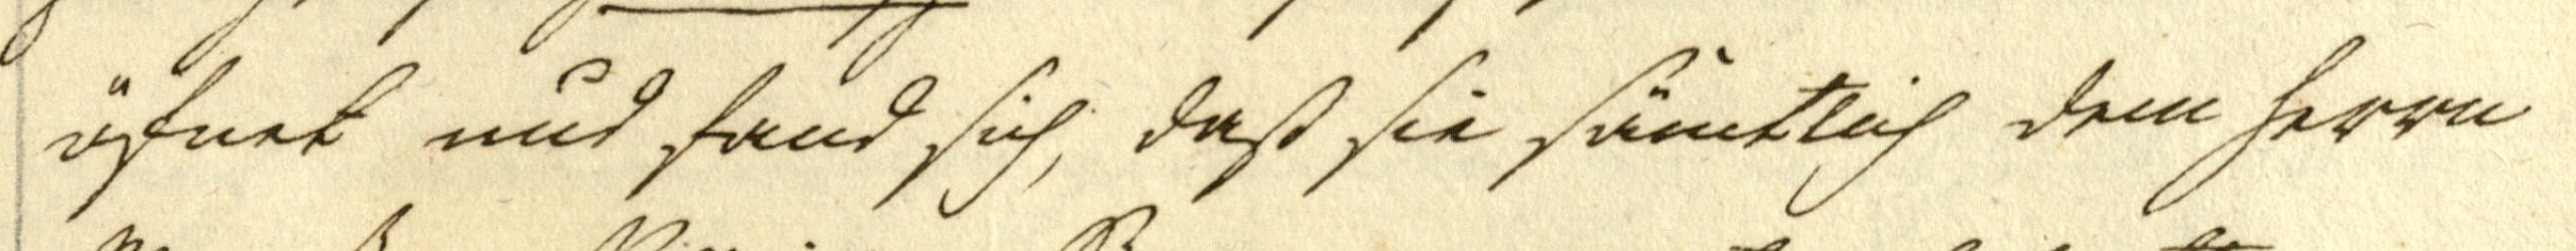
öfnet und fand sich, daß sie sämtlich dem Herrn
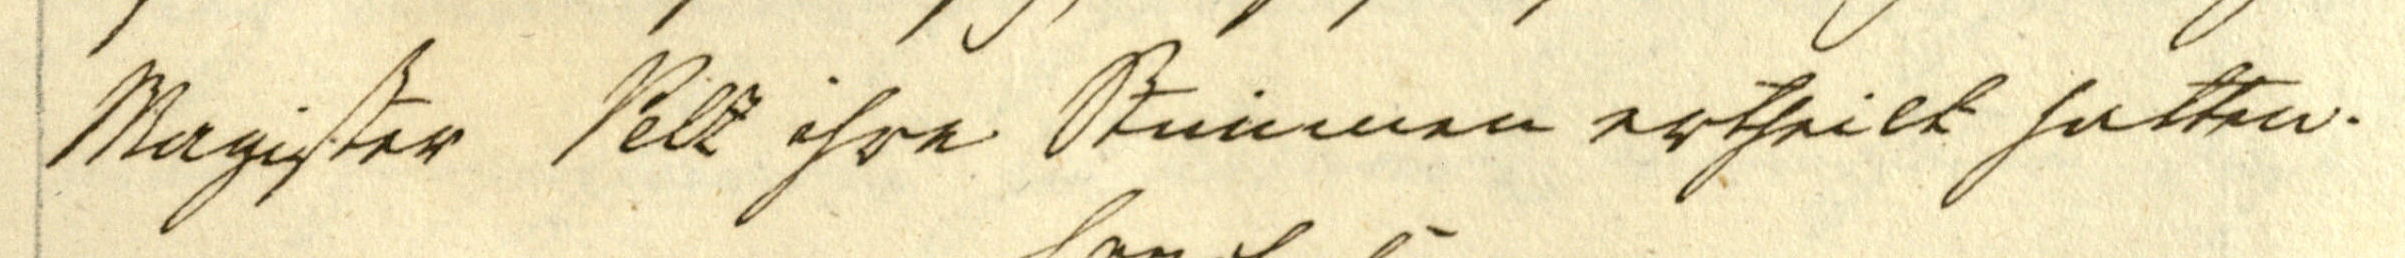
Magister Pelz ihre Stimmen ertheilt hätten.
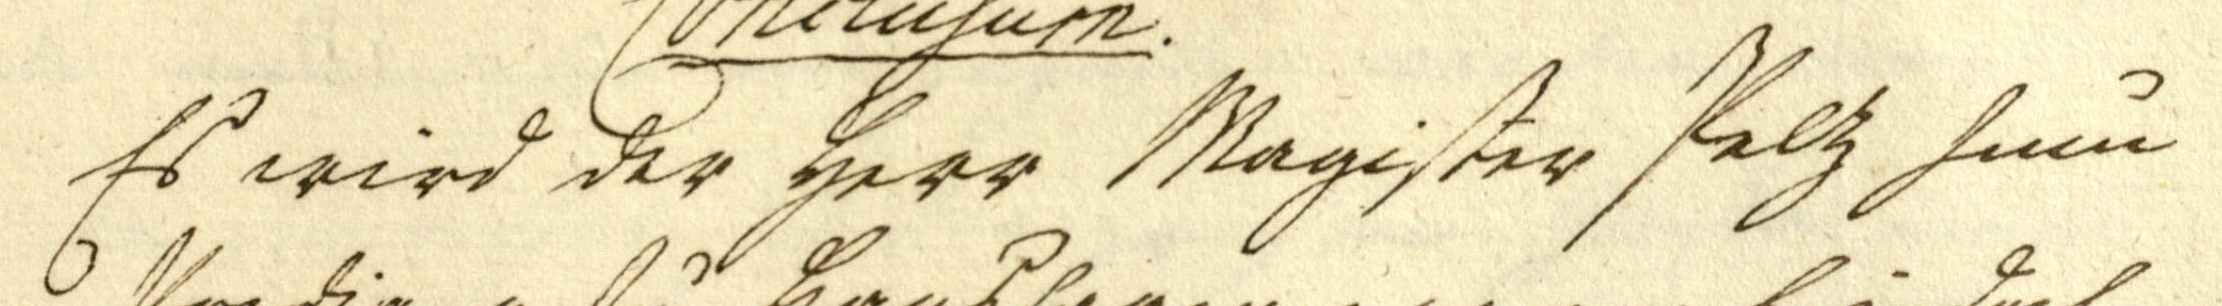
Es wird der Herr Magister Pelz zum
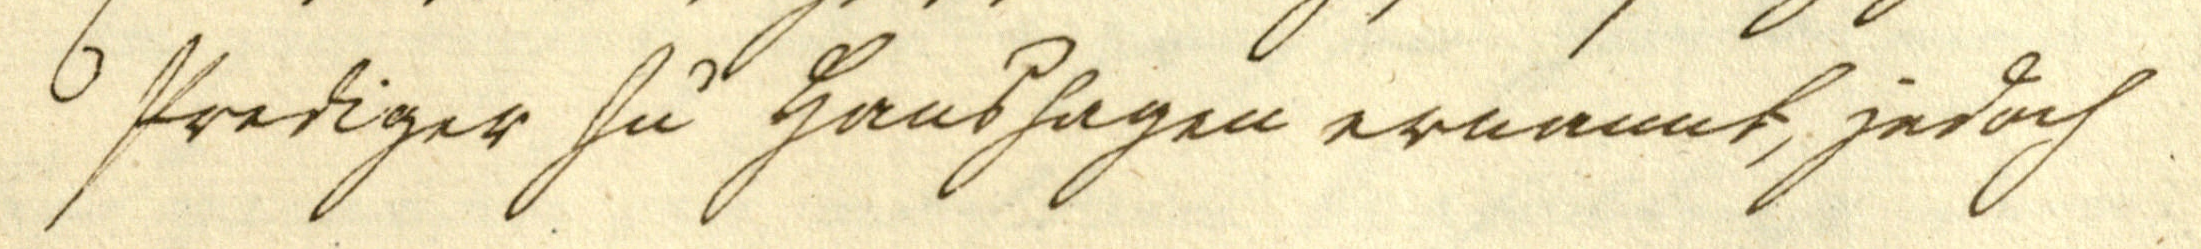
Prediger zu Hanshagen ernannt, jedoch
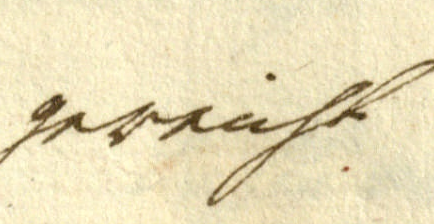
gereicht
